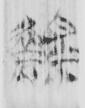鰥
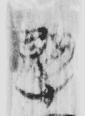{則心}
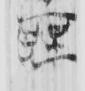聖
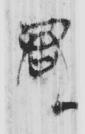君
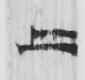上
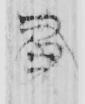有
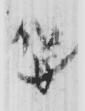{化心}
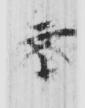不
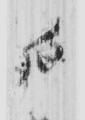加
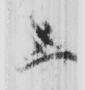之
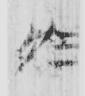於
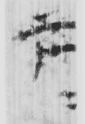下
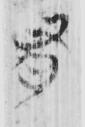有
